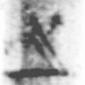之
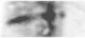一
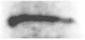一
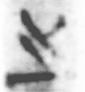之
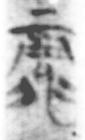彔（綠）
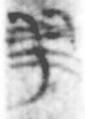○（羽）
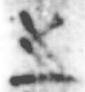之
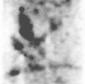之
